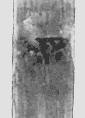四
